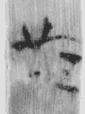{廿三}
